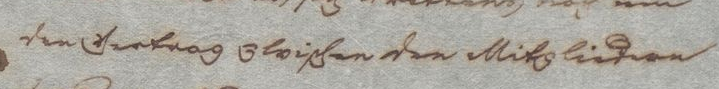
den Vertrag zwischen den Mitgliedern
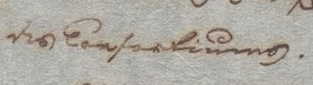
des Consortiums.
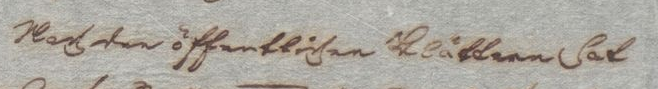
Nach den öffentlichen Blättern hat
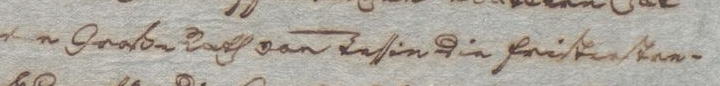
der Grosse Rath von Tessin die Fristerstre-
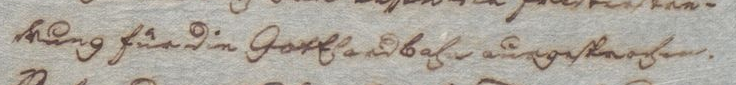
ckung für die Gotthardbahn ausgesprochen.
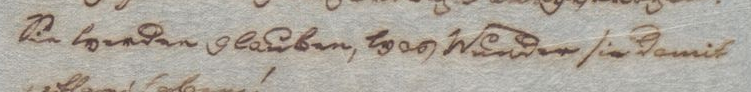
Sie werden glauben, was Wunder sie damit
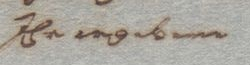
Ihr ergebene
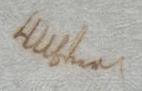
Escher
